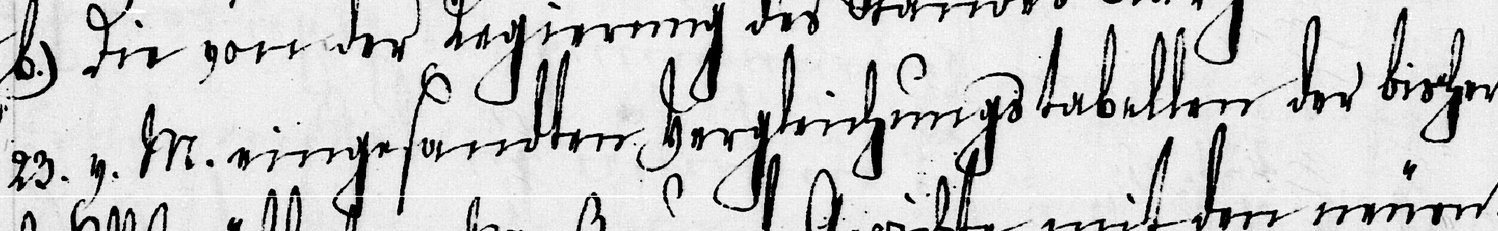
23. v. M. eingesandten Vergleichungstabellen der bisher
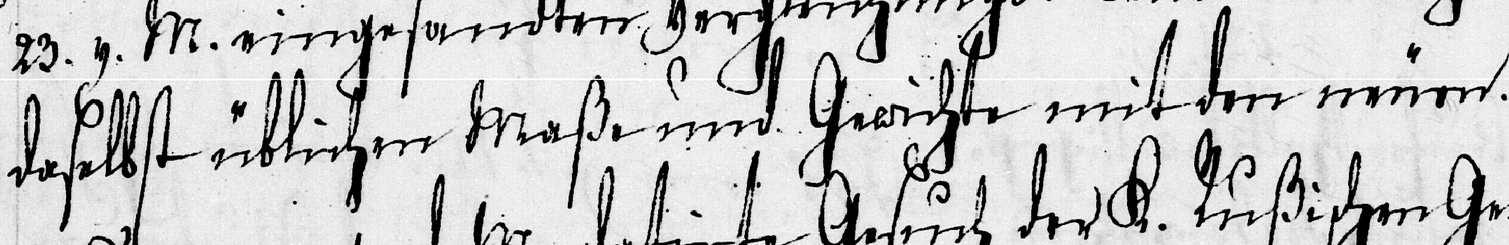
daselbst üblichen Maße und Gewichte mit den neuen.
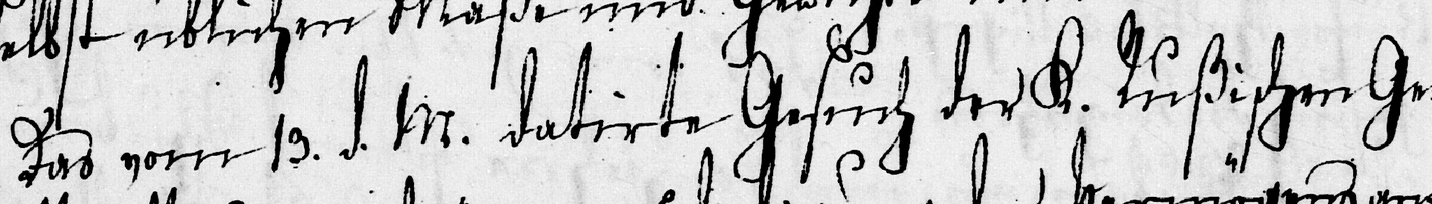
Das vom 13. d. M. datirte Gesuch der K. Rußischen G¬
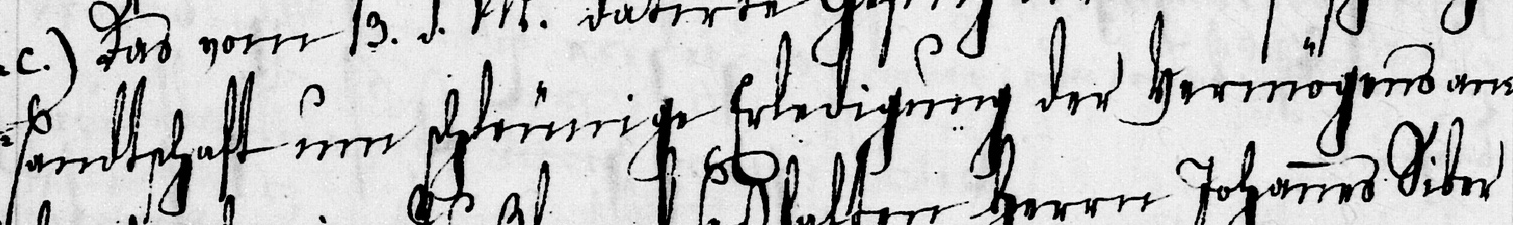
esandtschaft um schleunige Erledigung der Vermögensan¬
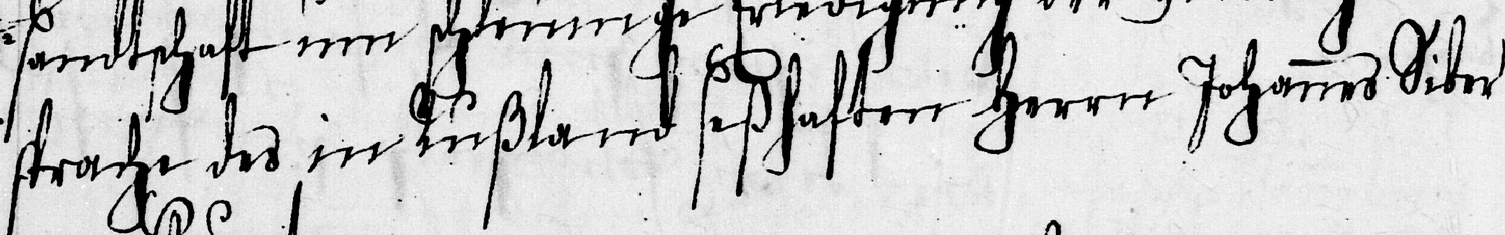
sprache des in Rußland seßhaften Herrn Johannes Siber
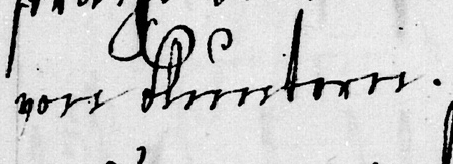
von Fluntern.
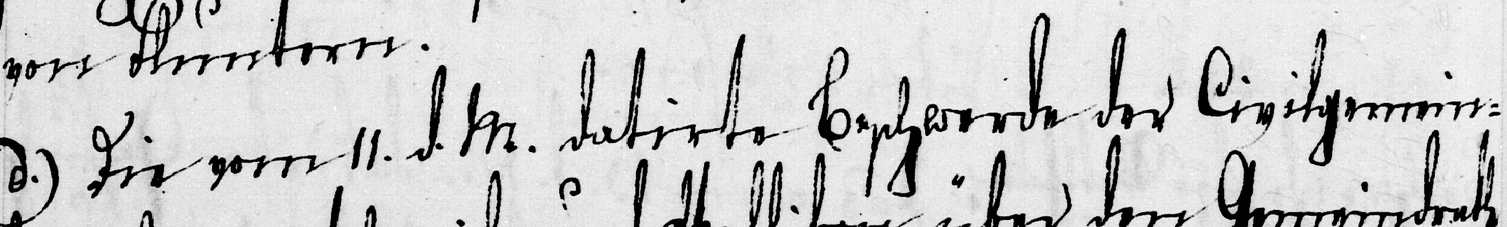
d.) Die vom 11. d. M. datirte Beschwerde der Civilgemein¬
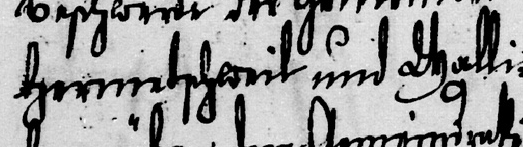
Hermatschweil und Wall¬
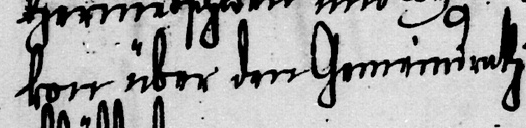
ikon über den Gemeindrath
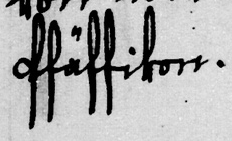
Pfäffikon,
